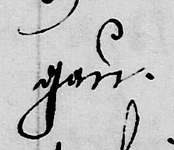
gau.
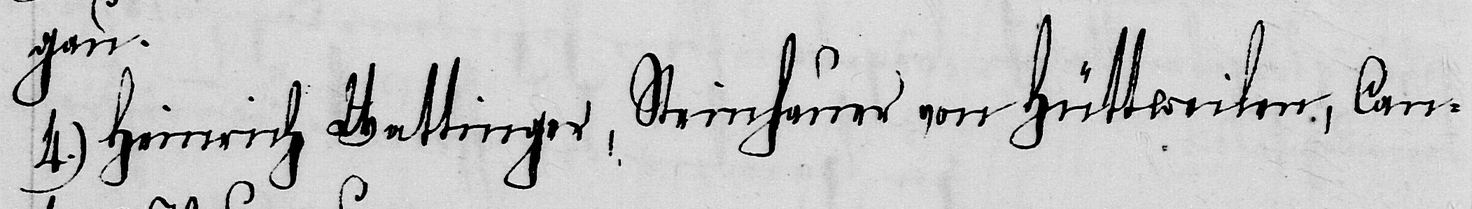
4.) Heinrich Wettinger, Steinhauer von Hüttweilen, Can¬
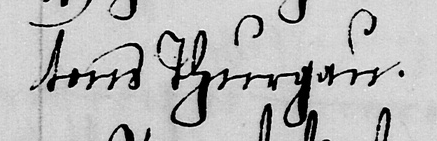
tons Thurgau.
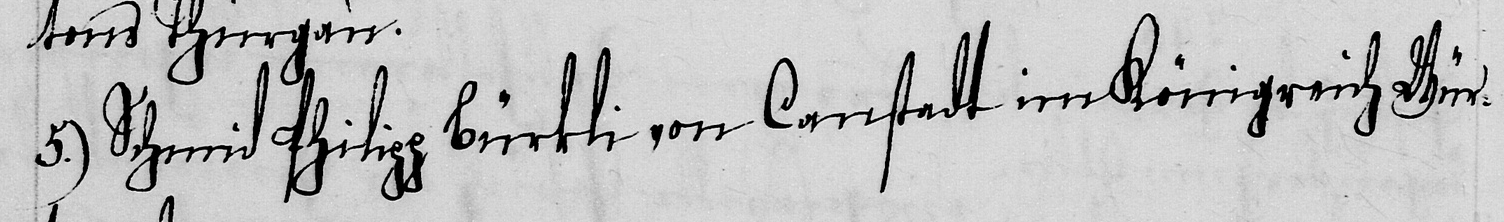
5.) Schmid Philipp Bürkli von Canstadt im Königreich Wür¬
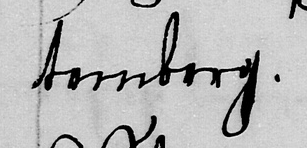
temberg.
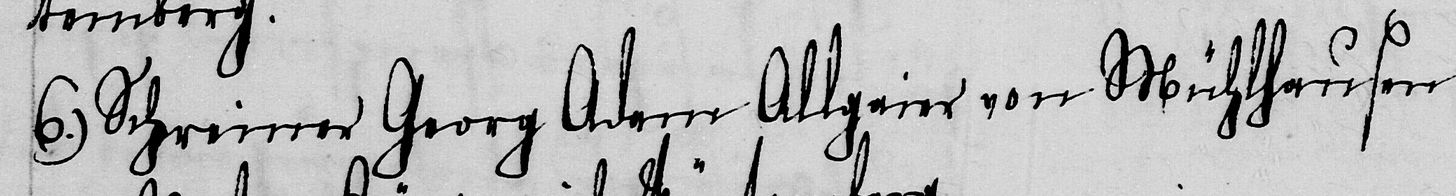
6.) Schreiner Georg Adam Allgaier von Mühlhausen
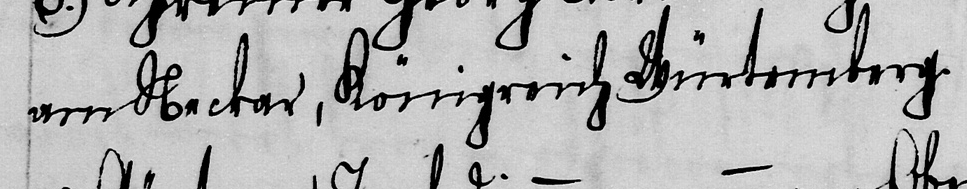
am Neckar, Königreich Würtemberg.
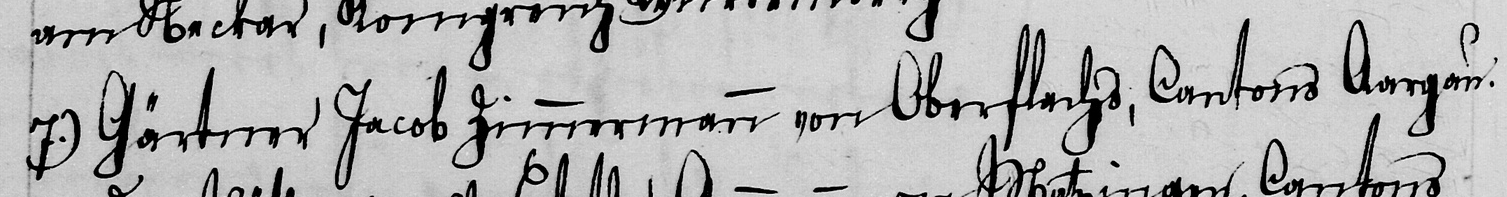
7.) Gärtner Jacob Zimmermann von Oberflachs, Cantons Aargau.
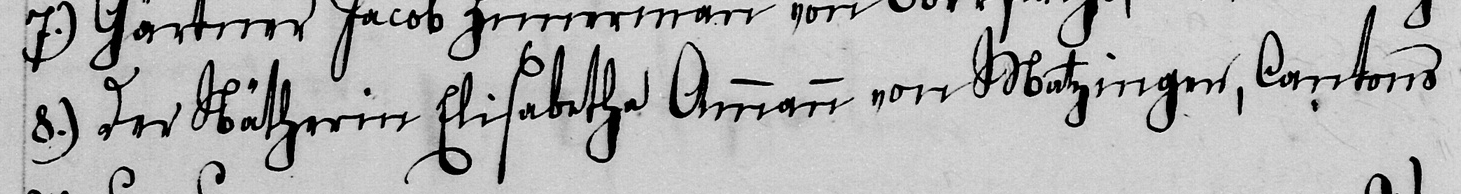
8.) Der Nätherin Elisabetha Ammann von Matzingen, Cantons
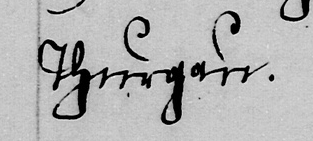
Thurgau.
